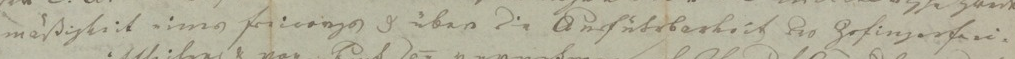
mäßigkeit eines Freicorps & über die Ausführbarkeit des Zofingerfrei-
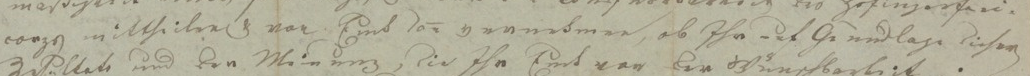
corps mittheilen & von Euch dann vernehmen, ob Ihr auf Grundlage dieser
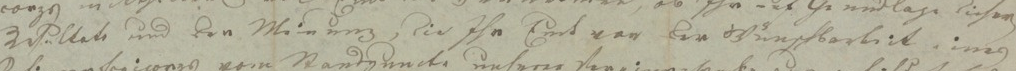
Resultate und der Meinung, die Ihr Euch von der Wünschbarkeit eines
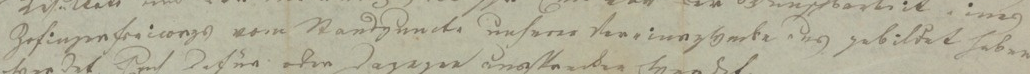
Zofingerfreicorps vom Standpuncte unserer Vereinszwecke aus gebildet haben
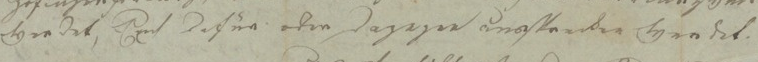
werdet, Euch dafür oder dagegen aussprechen werdet.
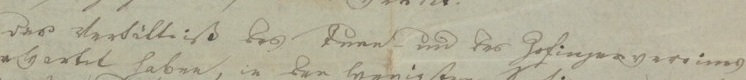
Das Verhältniß des Turn- und des Zofingervereines
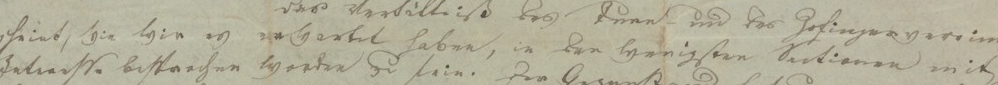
scheint, wie wir es erwartet haben, in den wenigsten Sectionen mit
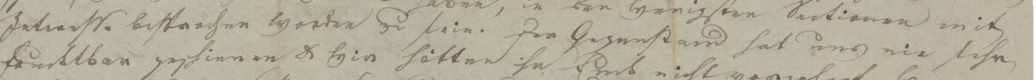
Interesse besprochen worden zu sein. Der Gegenstand hat uns nie sehr
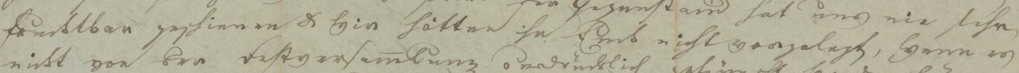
fruchtbar geschienen & wir hätten ihn Euch nicht vorgelegt, wenn es
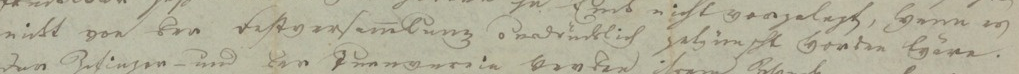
nicht von der Festversammlung ausdrücklich gewünscht worden wäre.
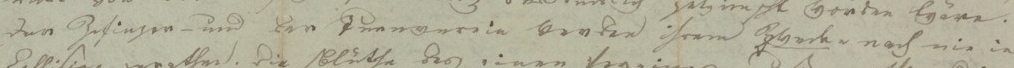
Der Zofinger- und der Turnverein werden ihrem Zwecke nach nie in
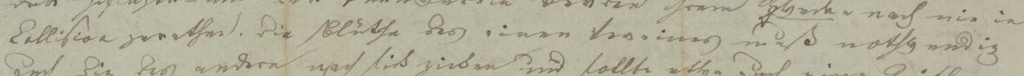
Collision gerathen. Die Blüthe des einen Vereines muß nothwendig
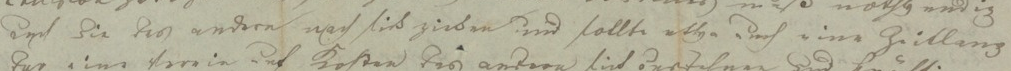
auch die des andern nach sich ziehen und sollte etwa auch eine Zeitlang
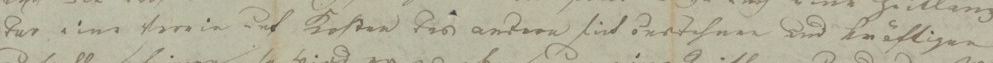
der eine Verein auf Kosten des andern sich ausdehnen und kräftigen
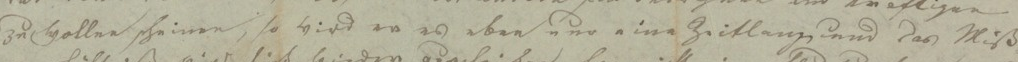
zu wollen scheinen, so wird er es eben nur eine Zeitlang, und das Miß-
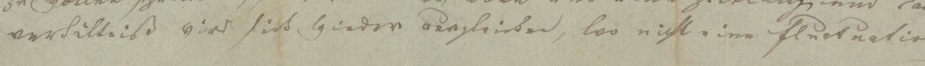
verhältniß wird sich wieder ausgleichen, wo nicht eine Fluctuation
